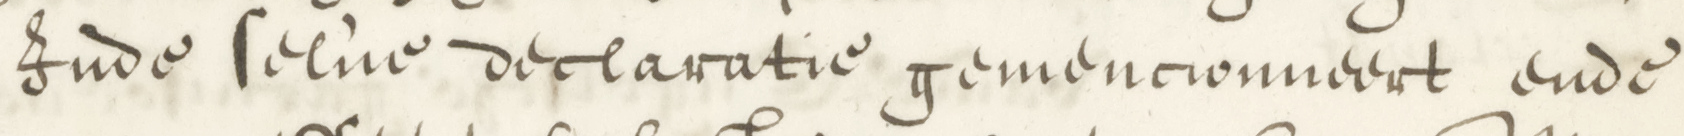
Inde selue declaratie gemencionneert ende
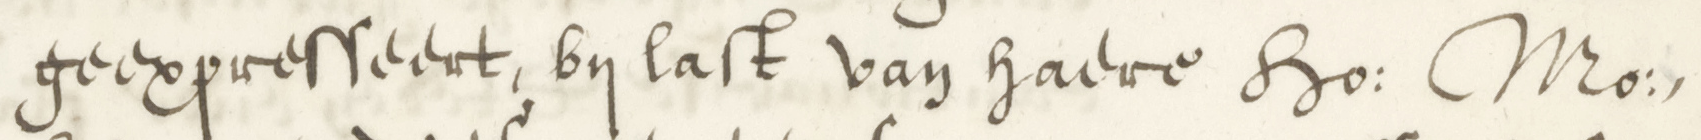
geexpresseert, bij last van haere Ho:Mo:,
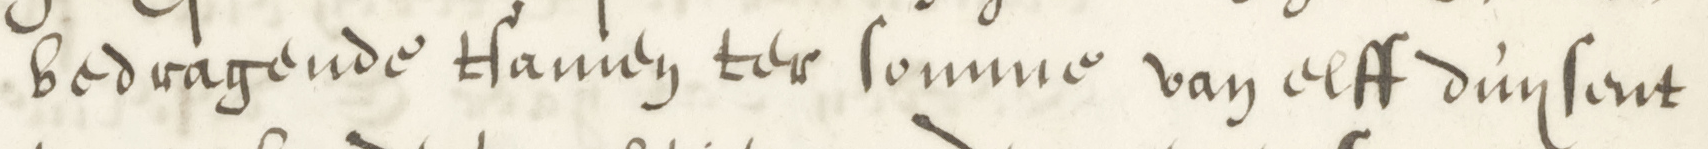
bedragende tsamen ter somme van elff duysent
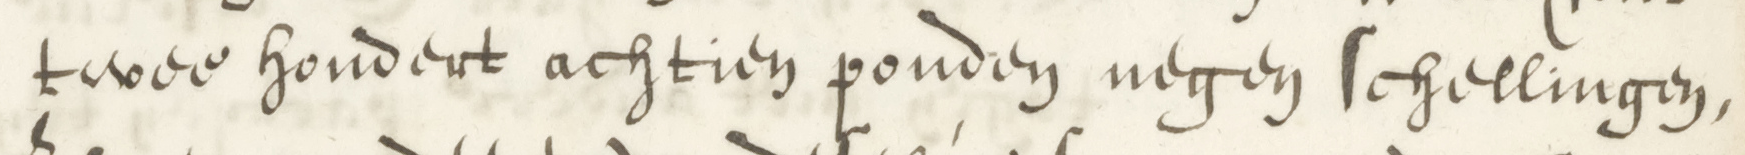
twee hondert achtien ponden negen schellingen,
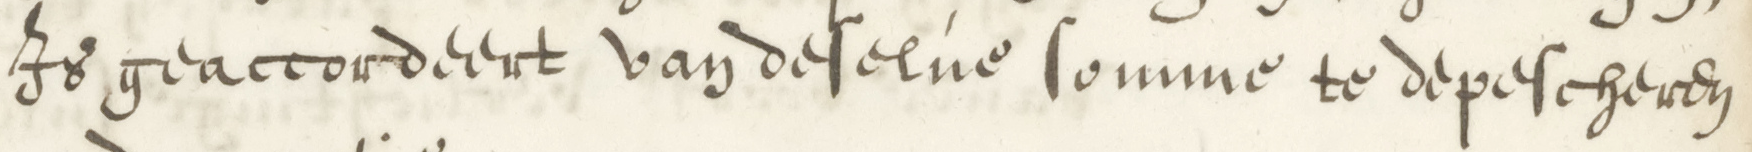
Is geaccordeert van deselue somme te depescheren
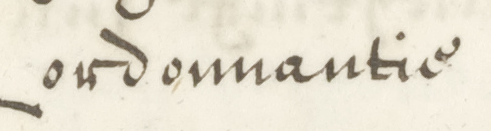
ordonnantie.
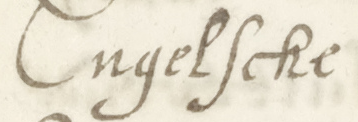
Engelsche
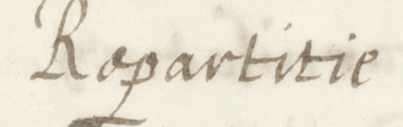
Repartitie
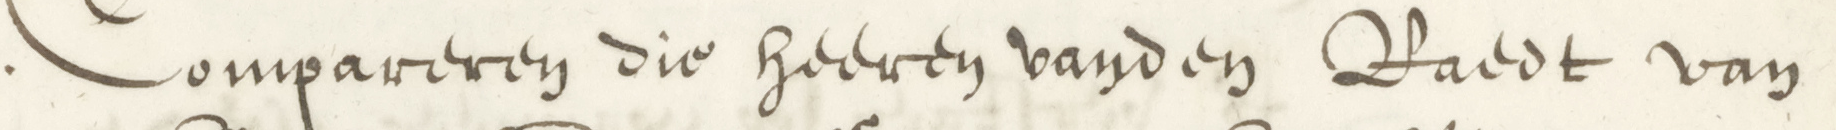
Compareren die heeren vanden Raedt van
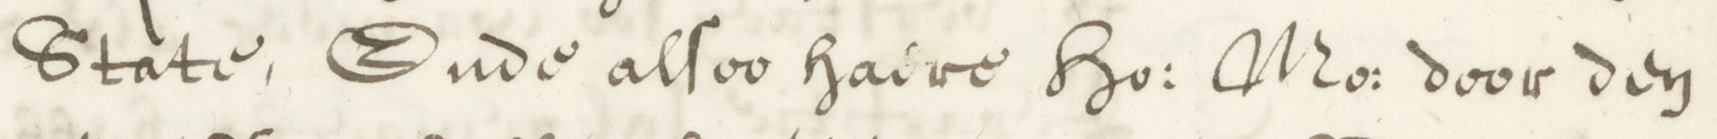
State, Ende alsoo haere Ho:Mo: door den
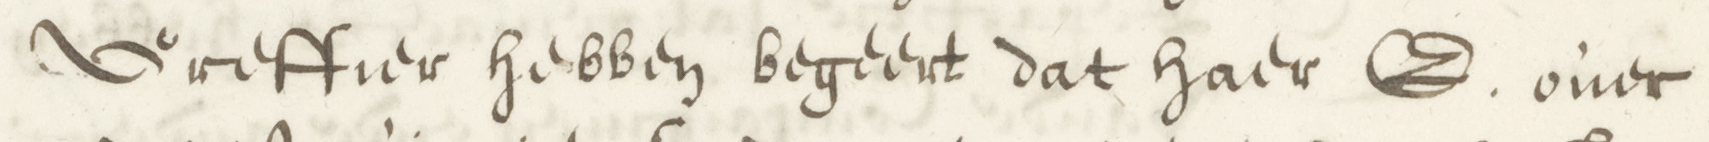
Greffier hebben begeert dat haer E. ouer
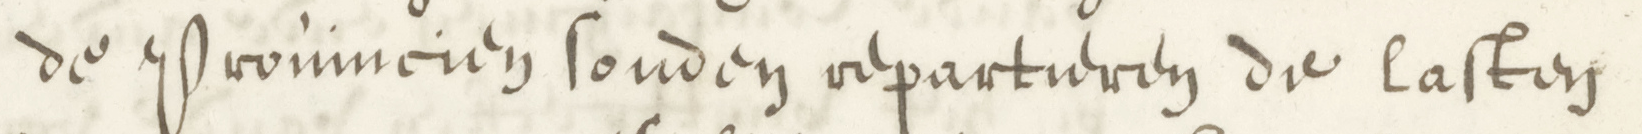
de Prouincien souden repartieren de lasten
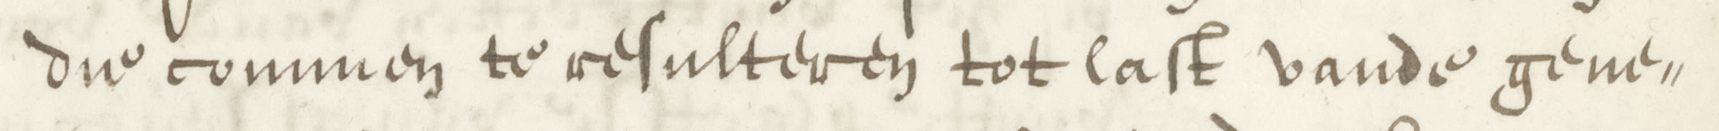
die commen te resulteren tot last vande gene„
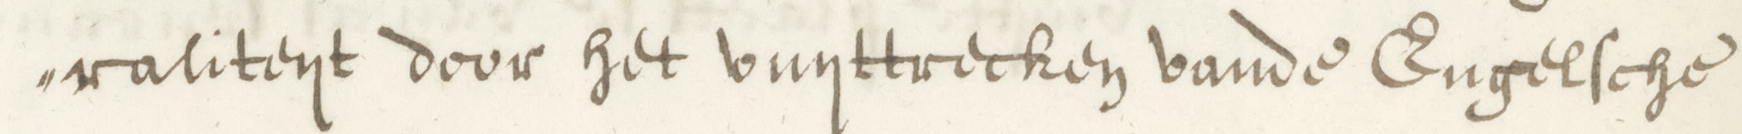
„raliteyt door het vuyttrecken vande Engelsche
